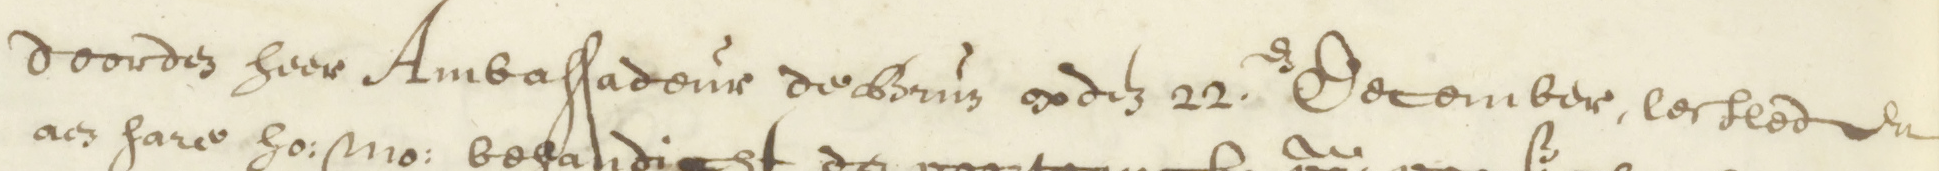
door den heer Ambassadeur de Brun opden 22en. December, lestleden
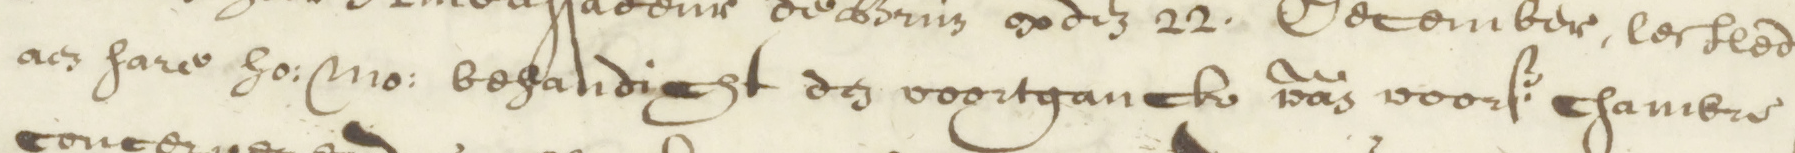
aen hare ho:Mo: behandicht den voortganck van voors chambre
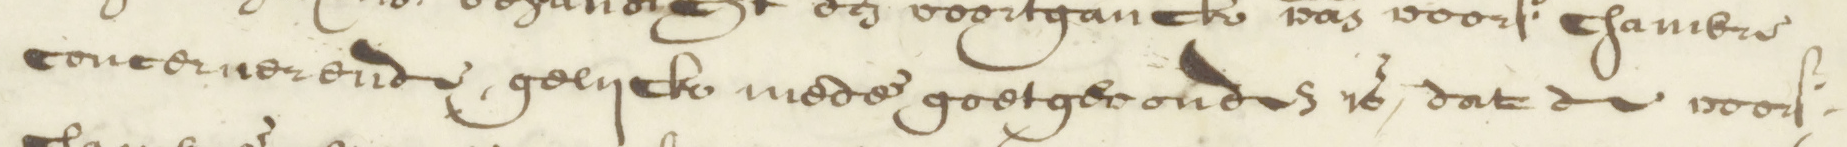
concernerende, gelyck mede goetgevonden is, dat de voors
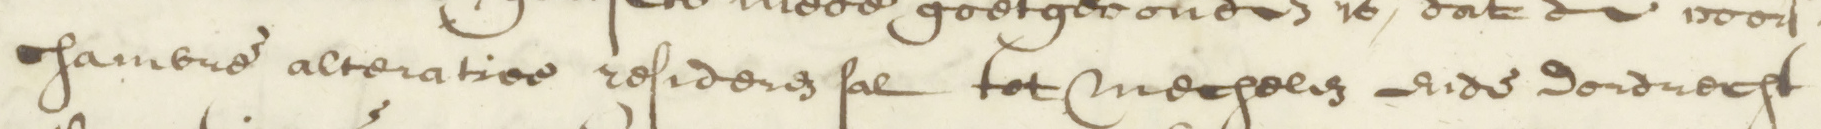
chambre alterative resideren sal tot Mechelen ende Dordrecht
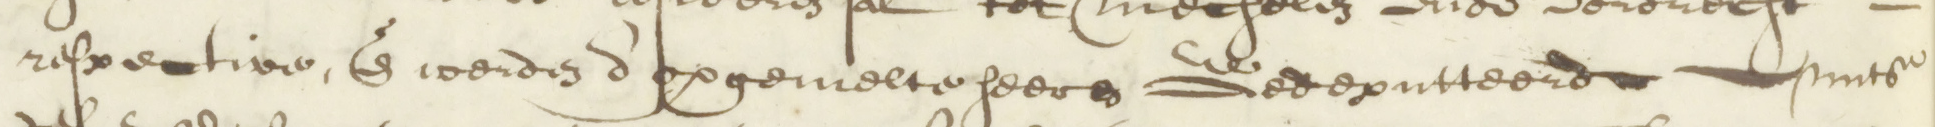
respective, & werden d'opgemelte heeren Gedeputteerde mits
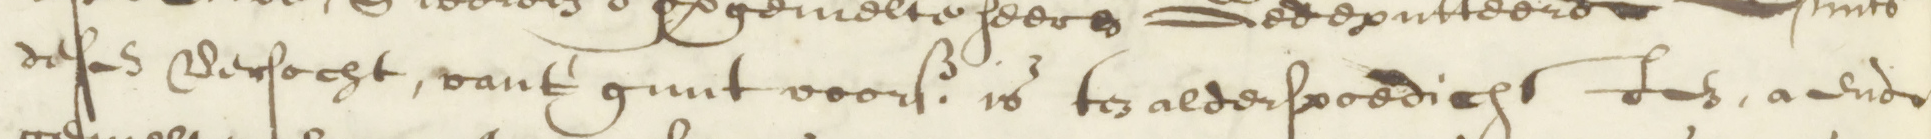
desen versocht, vant‛ gunt voors. is ten alderspoedichsten, aende
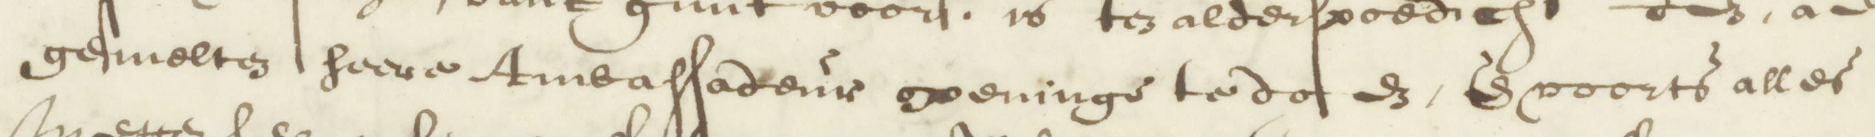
gemelten heere Ambassadeur openinge te doen, & voorts alles
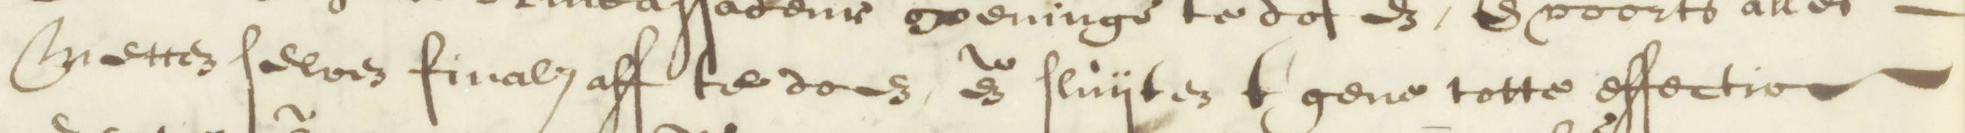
metten selven final aff te doen, en sluijten t‛gene totte effective
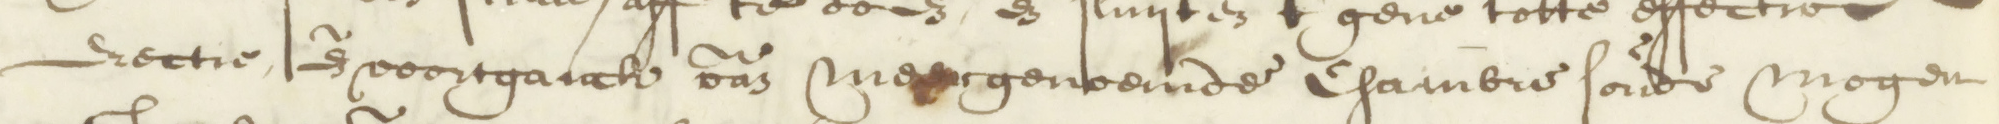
Erectie, & voortganck van meergenoemde Chambre soude mogen
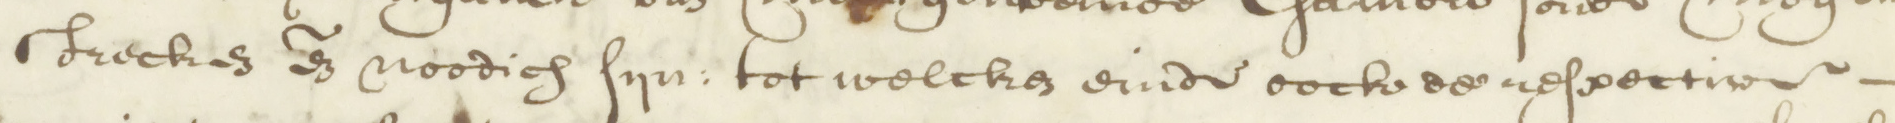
strecken en noodich syn: tot welcken einde oock de respective
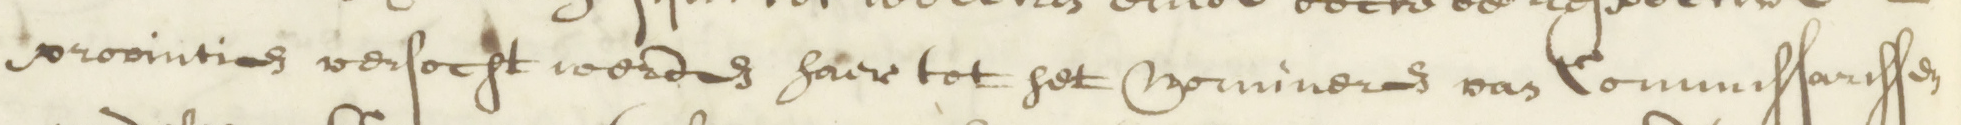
provintien versocht werden haer tot het nomineren van Commissarissen
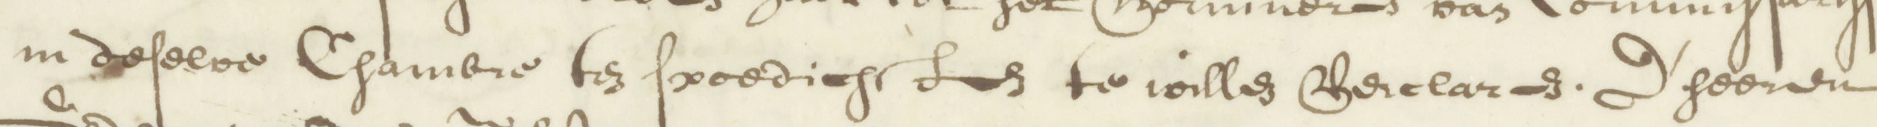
in deselve Chambre ten spoedichsten te willen Verclaren. D‛heeren
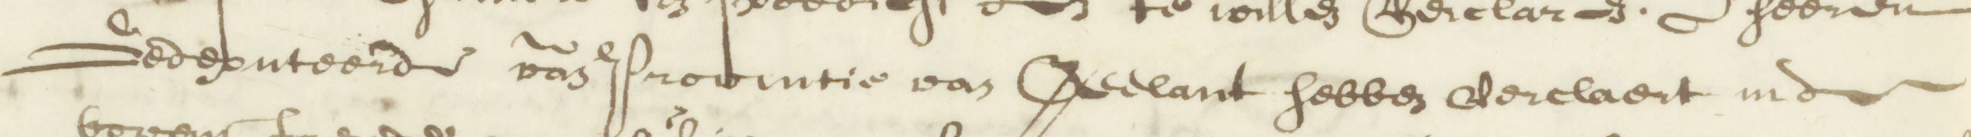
Gedeputeerde van Provintie van Zeelant hebben verclaert inde
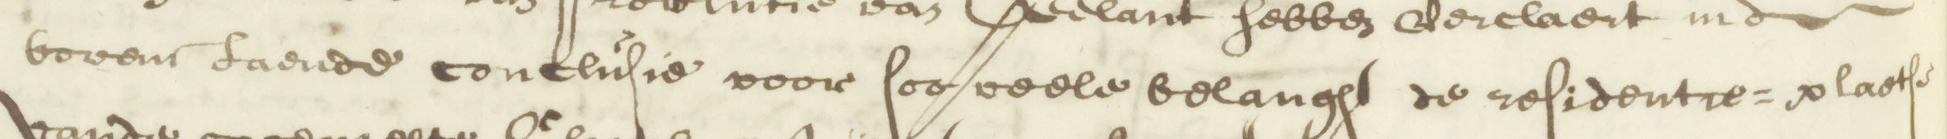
bovenstaende conclusie voor soo veele belanght de residentie=plaets
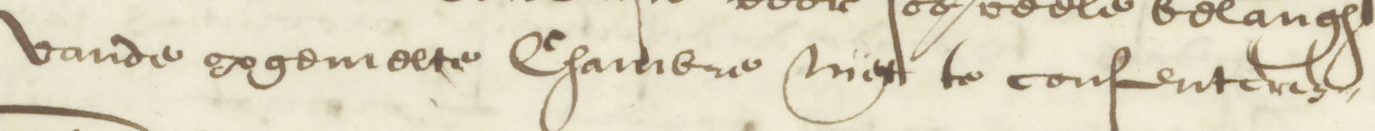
vande opgemelte Chambre niet te consenteren.
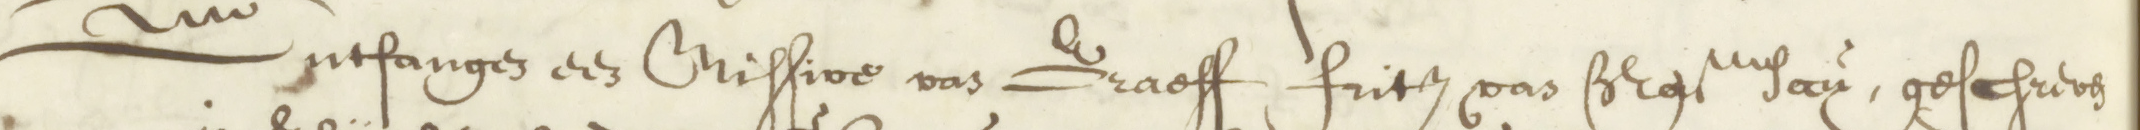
Ontfangen een Missive van Graeff Fritz van Nassau, geschreven
